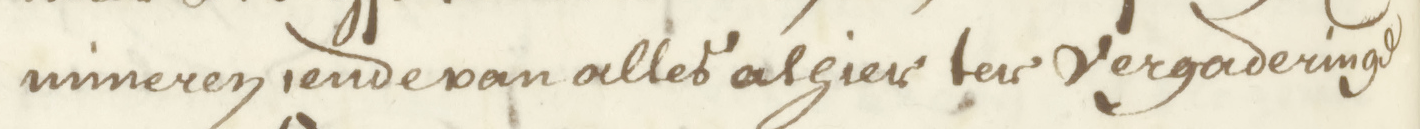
mineren, ende van alles alhier ter Vergaderinge
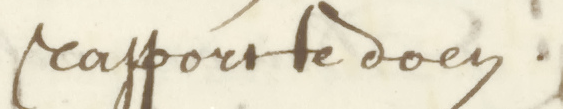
rapport te doen.
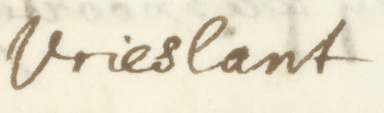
Vrieslant
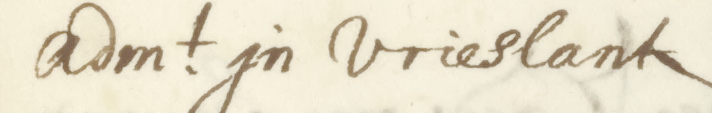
Admt. in Vrieslant
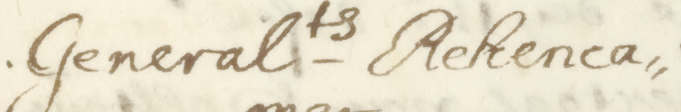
Generalts Rekenca„
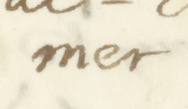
mer
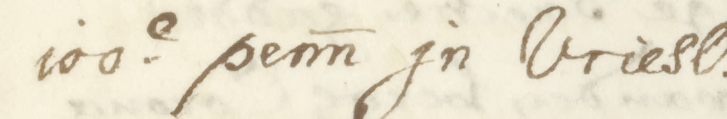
100e penn in Vrieslt
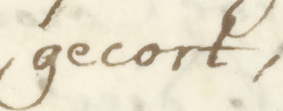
gecort.
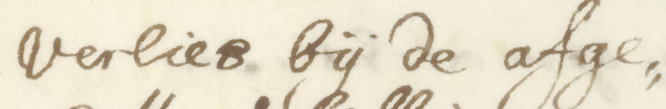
verlies bij de afge„
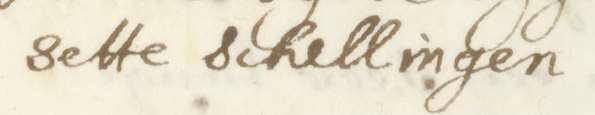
sette schellingen
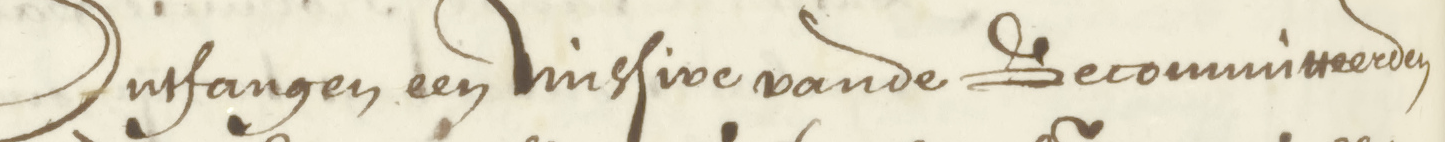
Ontfangen een Missive vande Gecommitteerden
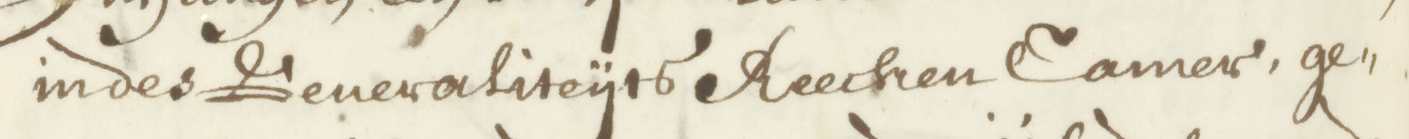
indes Generaliteijts Reecken Camer, ge„
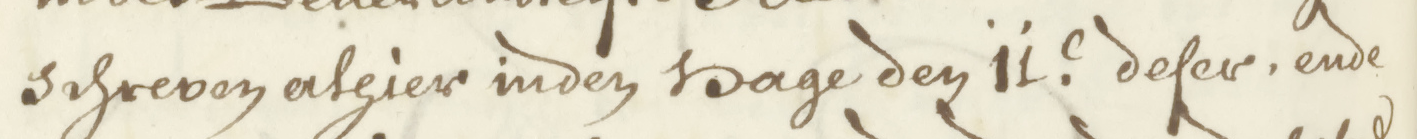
schreven alhier inden Hage den 11e. deser, ende
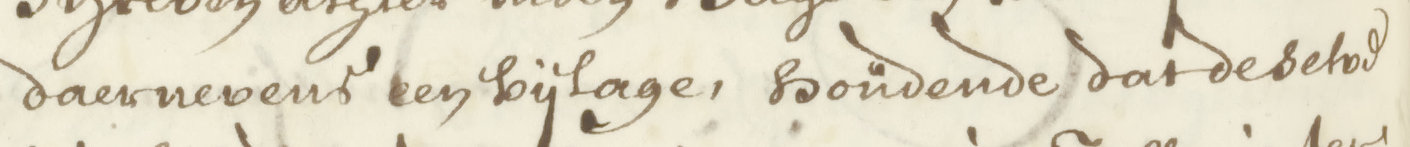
daernevens een bijlage, houdende dat deselve
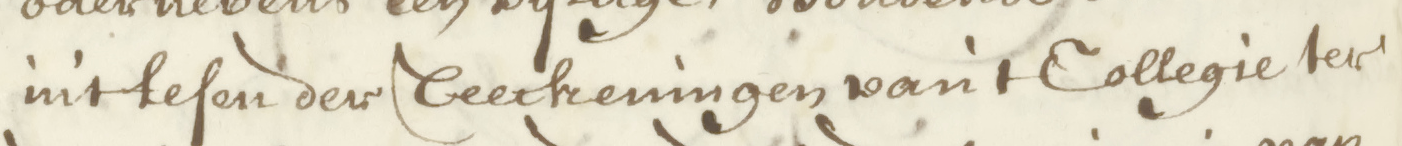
in‛t lesen der Reeckeningen van‛t Collegie ter
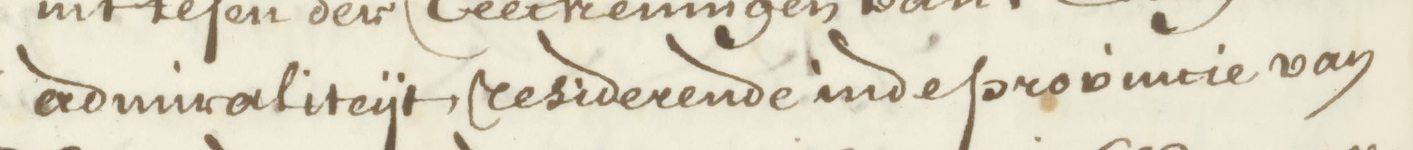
admiraliteijt, residerende inde provincie van
